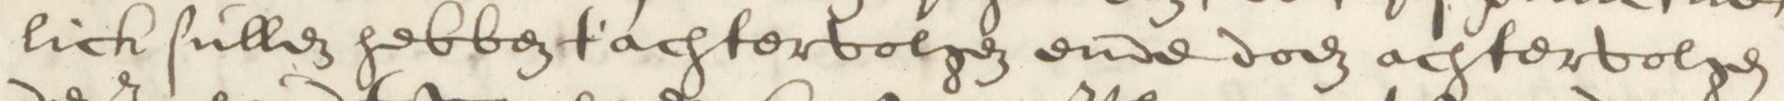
lick sullen hebben t'achtervolgen ende doen achtervolgen
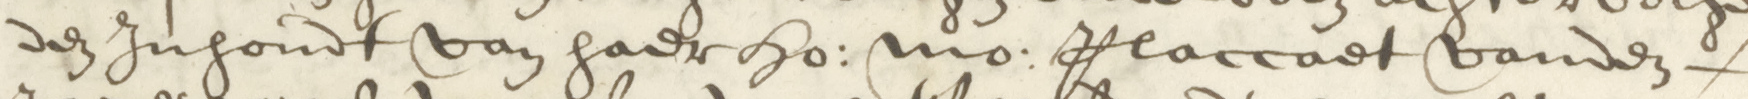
den Inhoudt van haer Ho:Mo: Placcaet vanden —
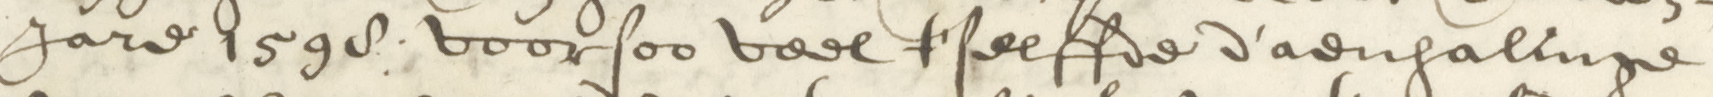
jare 1598 voor soo veel t'selffde d'aenhalinge
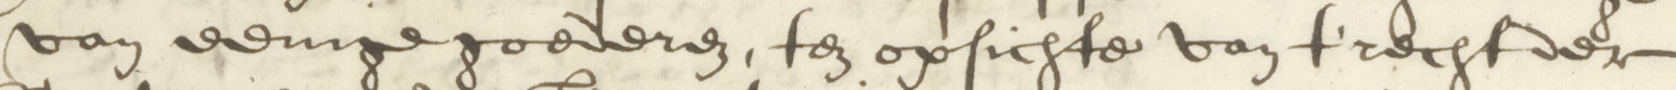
van eenige goederen, ten opsichte van t'recht der
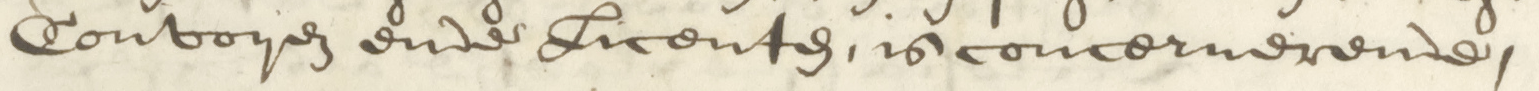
Convoijen ende Licenten, is concernerende.
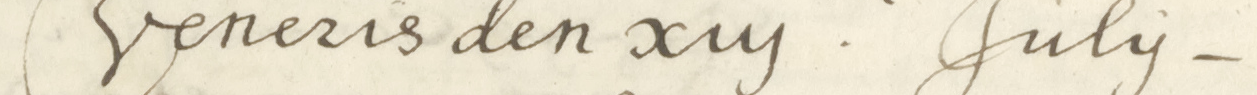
Veneris den xiijen. Julij-
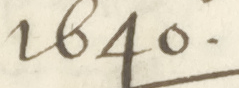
1640.
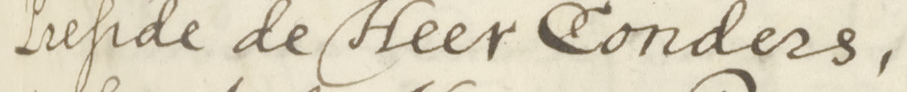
Preside de Heer Conders,
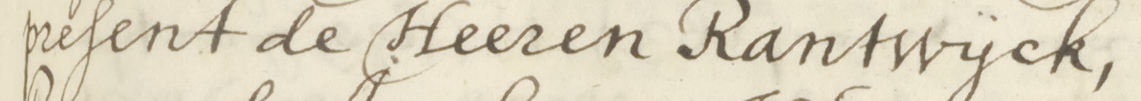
present de Heeren Rantwijck,
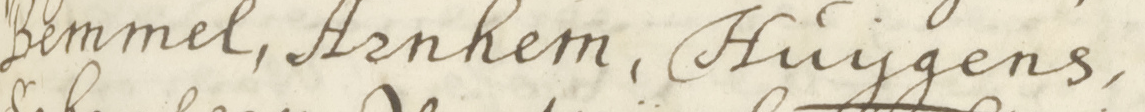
Bemmel, Arnhem, Huijgens,
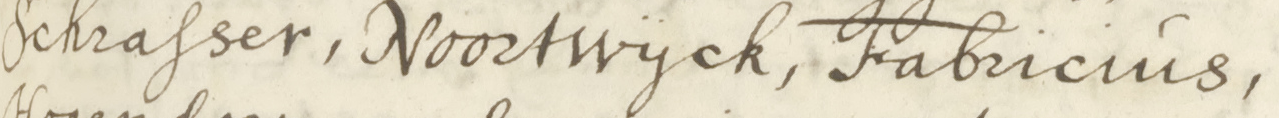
Schrasser, Noortwijck, Fabricius,
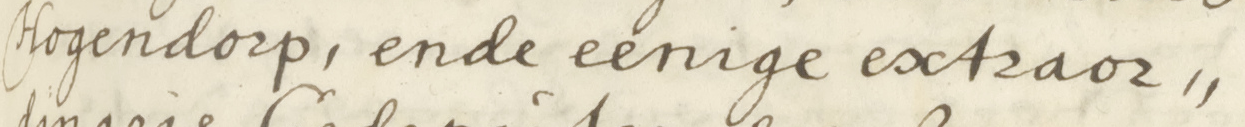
Hogendorp, ende eenige extraor„
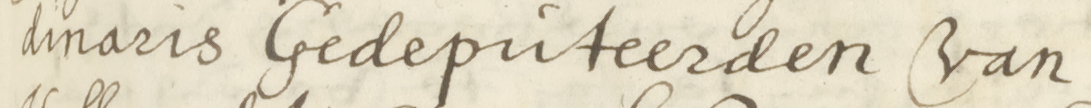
dinaris Gedeputeerden van
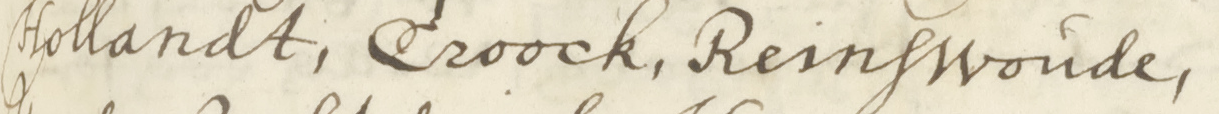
Hollandt, Croock, Reinswoude,
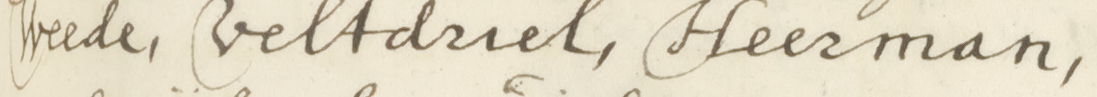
Weede, Veltdriel, Heerman,
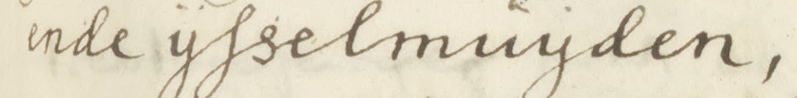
ende ijsselmuijden,
